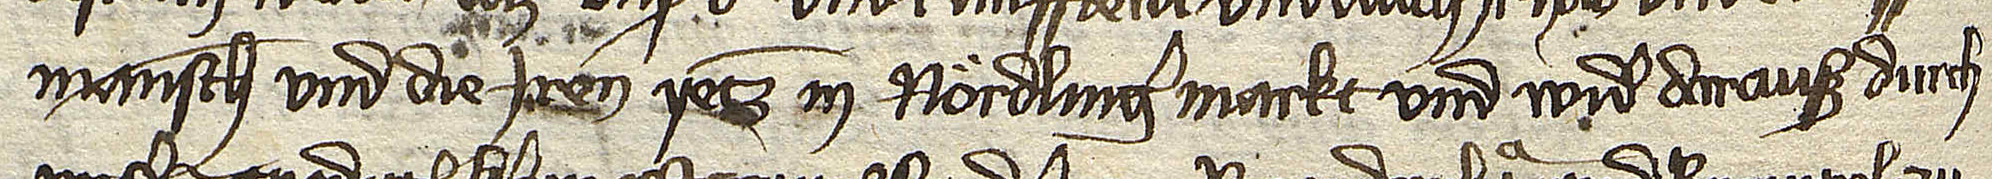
manſch* vnd die Iren yecʒ* in Nördling* markt vnd wid* darauſʒ durch
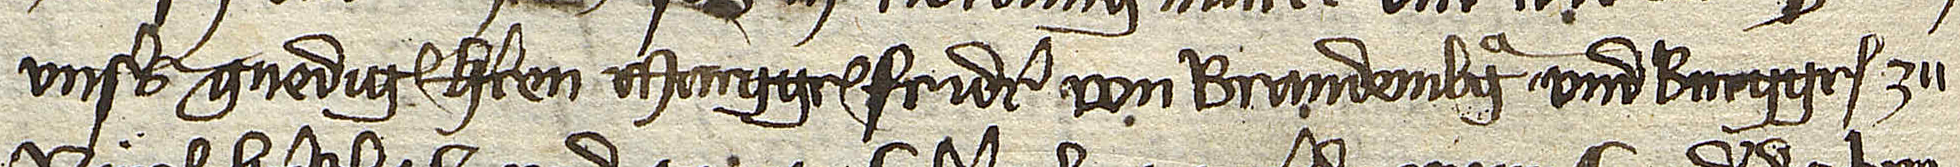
vnſ*s gnedig* h*ren Marggr* fridr* von Brandemb*g / vnd Burggr* ʒu
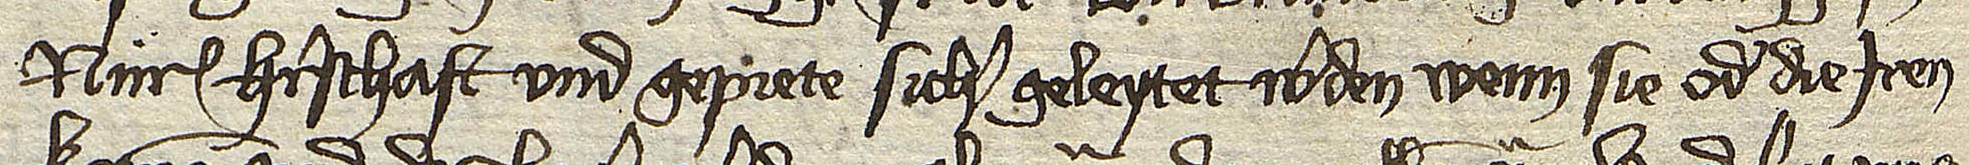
Nür* h*rſchaft vnd gepiete ſich* geleytet w*den wenn ſie od* die Iren
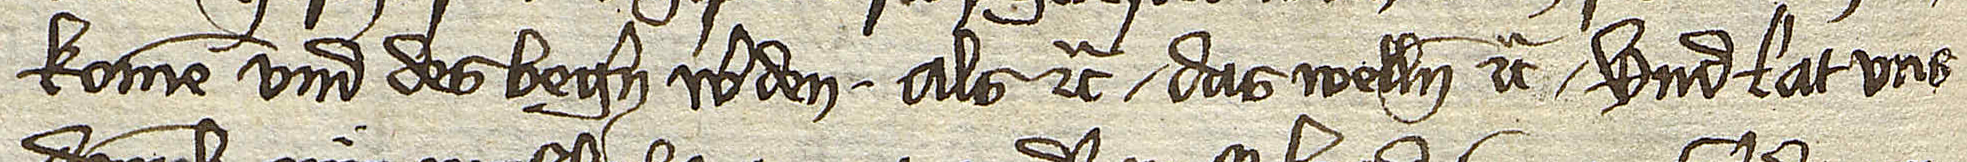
kome* vnd des beg*n w*den / Als ec* / Das welln* ec* / Vnd lat vns
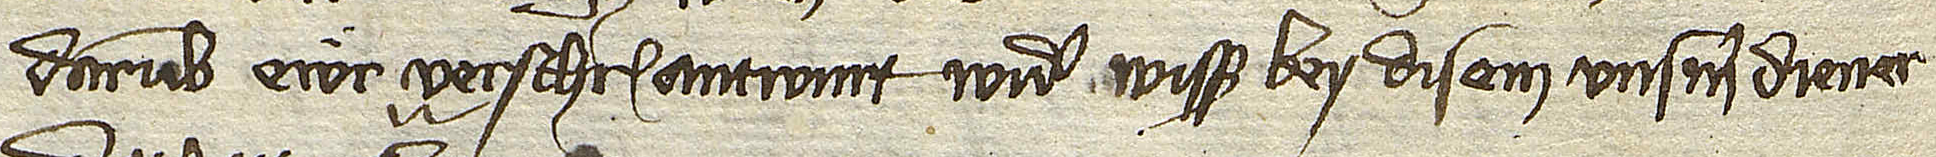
darub* eẅr verſchr* antwurt wid* wiſſ* bey diſem vnſm* diener
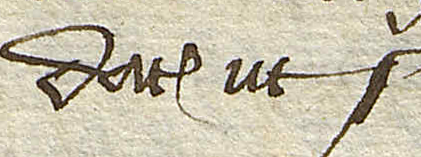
Dat* ut ſ*
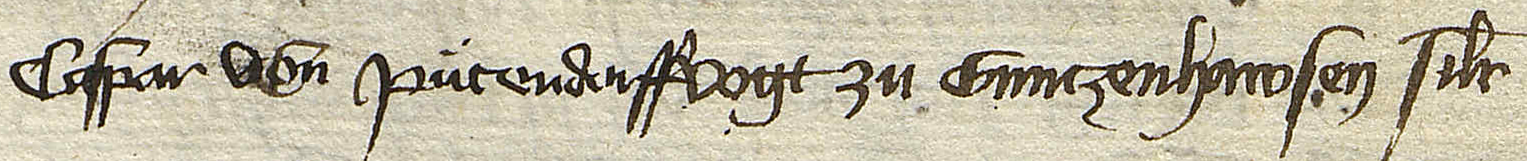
Caſpar von pütendorffvogt ʒu Guncʒenhawſen ſilr*
